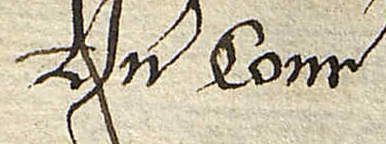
Hn* Conr*
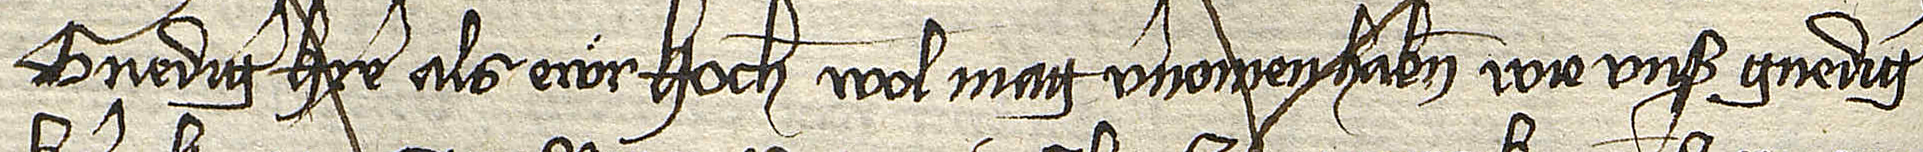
Gnedig* h*re als eẅr Hoch* wol mag v*nomen habn* wie vnſ* gnedig*
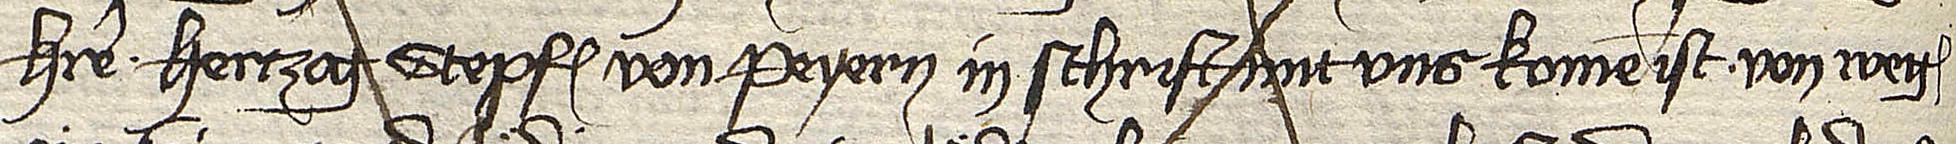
h*re . hercʒog Stepf* von Peyern in ſchrift mit vns kome* iſt . von weg*
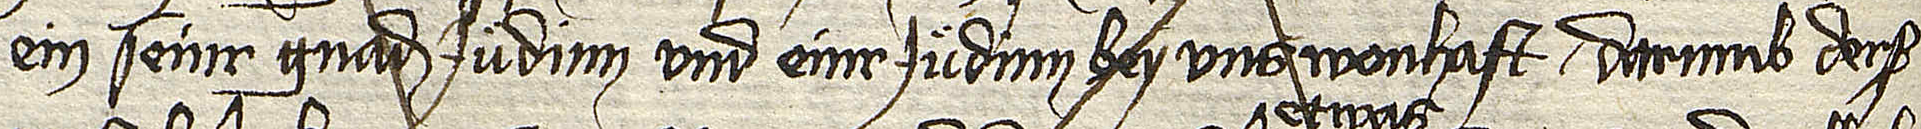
ein ſeinr gnad* Iüdinn vnd einr Iüdinn bey vns wonhaft / Darumb derſ*
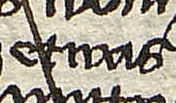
etwas
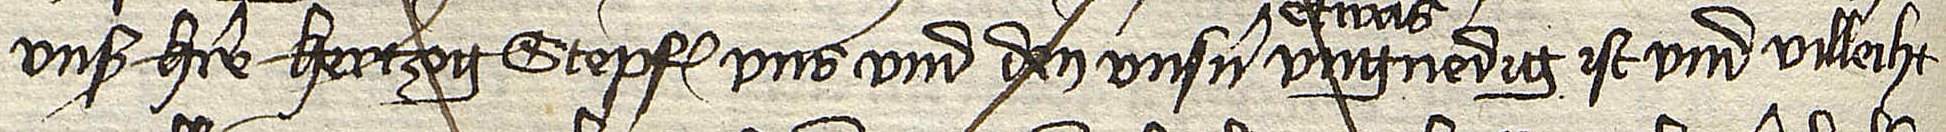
vnſ* h*re hercʒog Stepf* vns vnd den vnſn* vngnedig iſt vnd villeiht
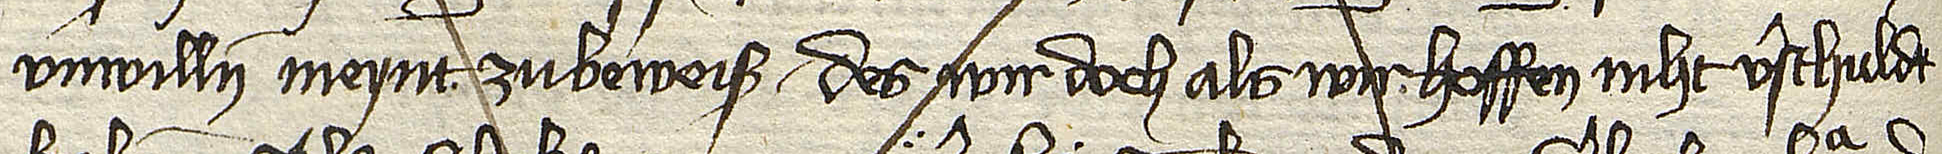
vnwilln* meynt ʒu beweiſ* / Des wir doch als wir hoffen niht v*ſchuldt
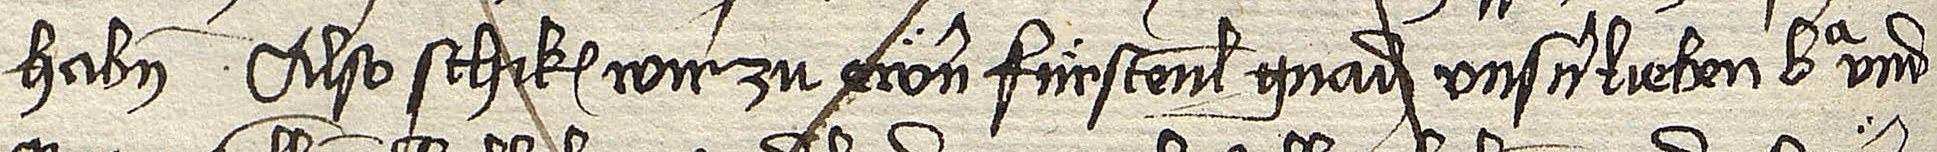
habn* . Alſo ſchik* wir ʒu eẅ*n fürſtenl* gnad* vnſn* lieben b* vnd
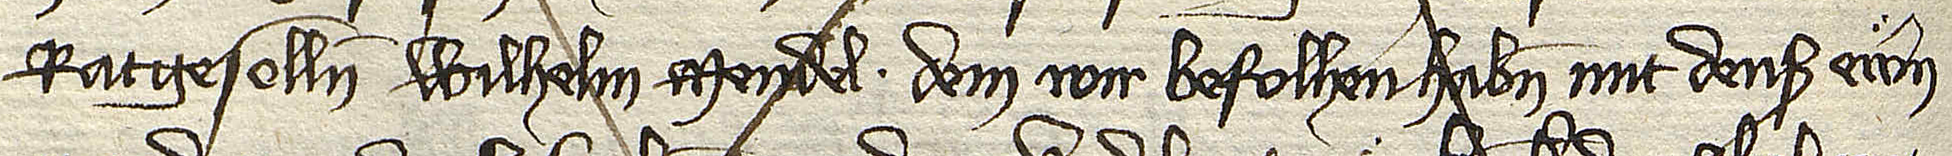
Ratgeſelln* Wilhelm Mendel . dem wir befolhen habn* mit denſ* eẅ*n
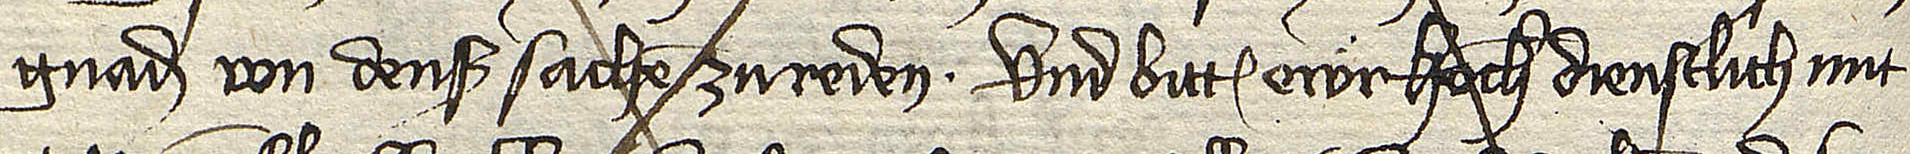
gnad* von denſ* ſache* ʒureden . Vnd bitt* eẅr hoch* dienſtlich mit
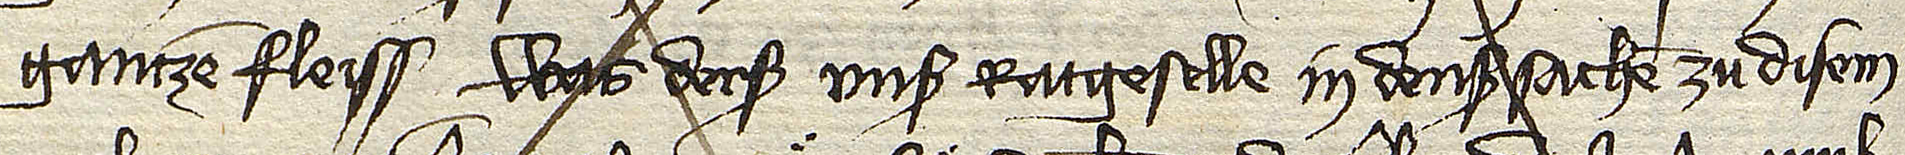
gancʒe* fleiſſ Was derſ* vnſ* Ratgeſelle in denſ* ſache* ʒu diſem
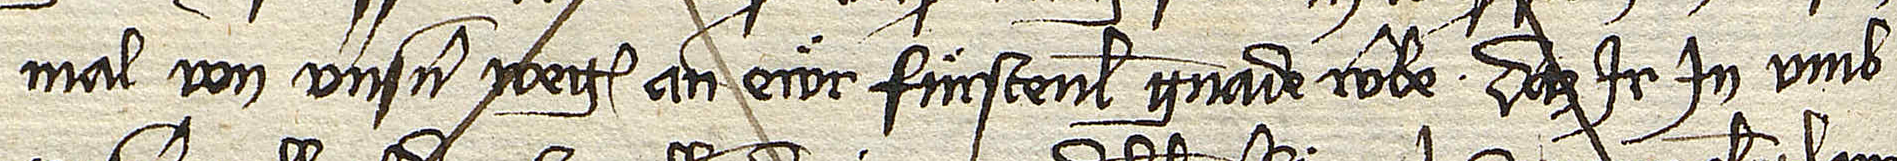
mal von vnſn* weg* an eẅr fürſtenl* gande w*be . Daʒ Ir In vmb
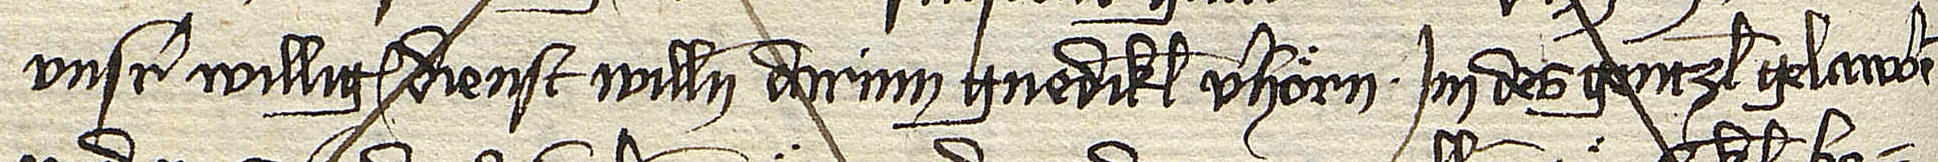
vnſr* willig* dienſt willn* darinn gnedikl* v*hörn . Im des gencʒl* gelawbe*
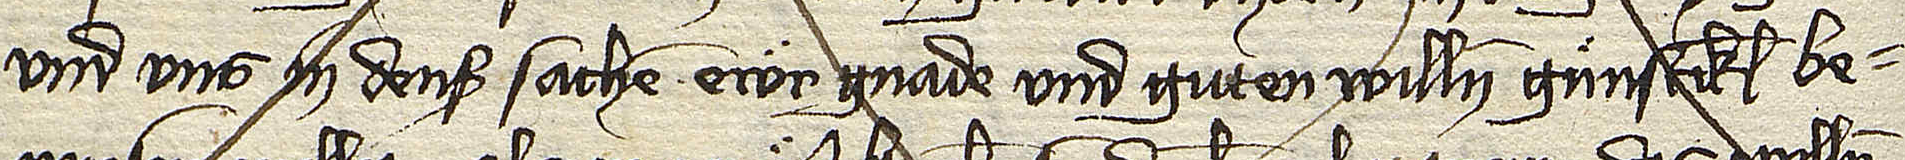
vnd vns in denſ* ſache* . eẅr gnade vnd guten willn* günſtikl* be =
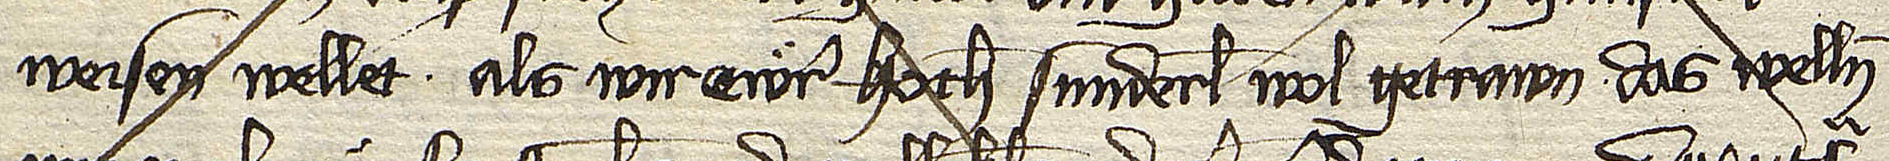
weiſen wellet . als wir eẅr* hoch* ſunderl* wol getrawn . das welln*
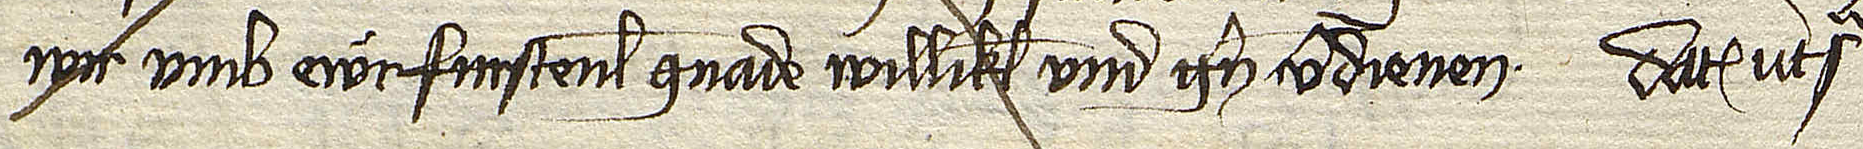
wir vmb eẅr furſtenl* gnade willikl* vnd g*n v*dienen . Dat* ut ſ*
